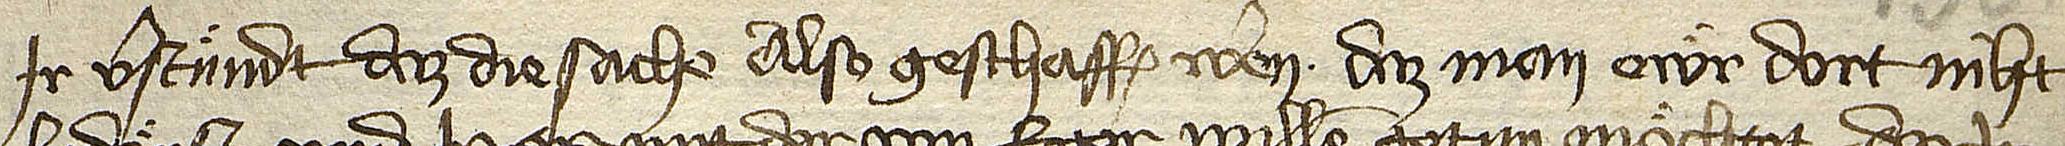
Ir v*ſtündt daʒ die ſache Alſo geſchaff* w*en . daʒ man eẅr dort niht
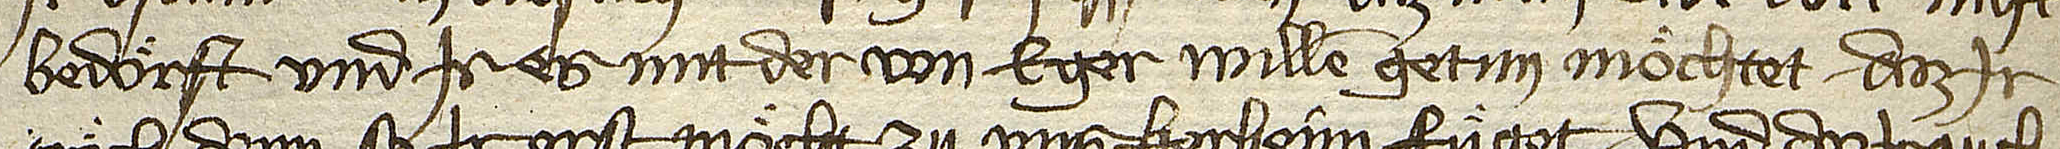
bedörft vnd Ir es mit der von Eger wille* getan möchtet / daʒ Ir
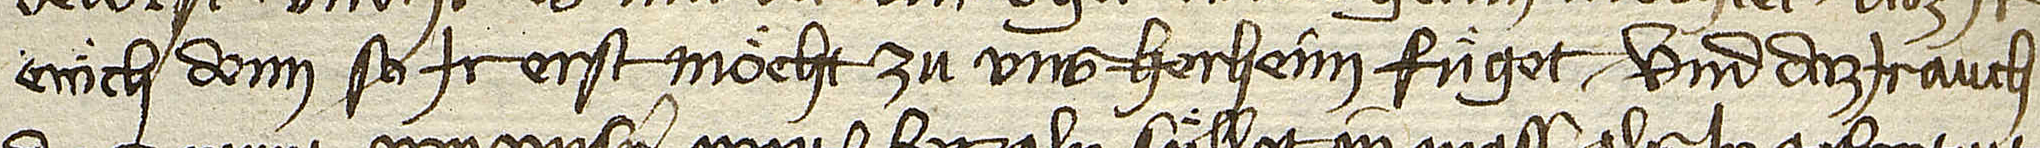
eẅch denn ſo Ir erſt möcht ʒu vns herheim füget / Vnd daʒ Ir auch
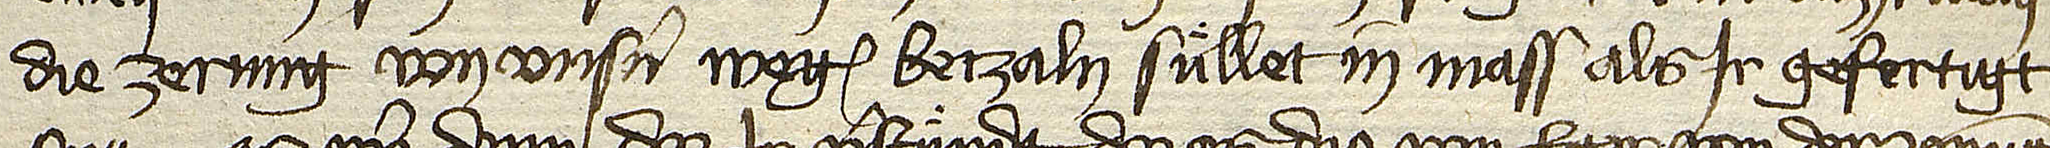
die ʒerung von vnſn* weg* becʒalen ſüllet in maſſ als Ir gefertigt
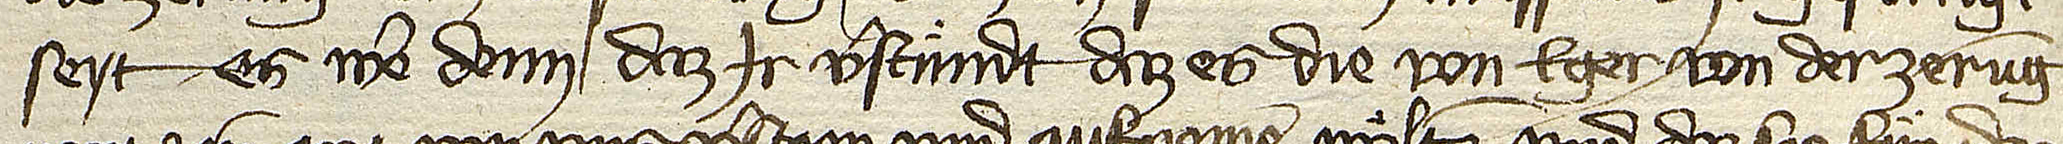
ſeyt / es w*e denn daʒ Ir v*ſtündt daʒ es die von Eger von der ʒerug*
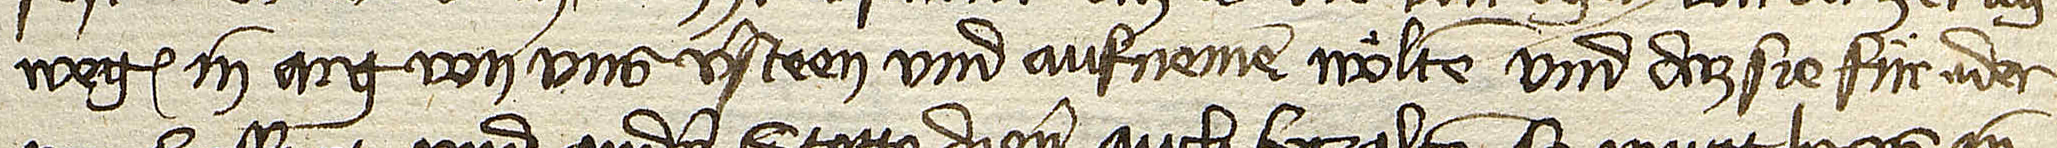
weg* in arg von vns v*ſteen vnd aufnem* wölte* vnd daʒ ſie für ~ der
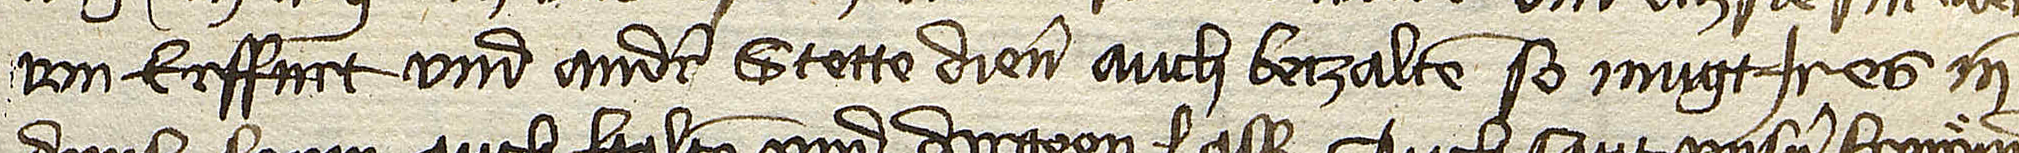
von Erffurt vnd andr* Stette dien* auch becʒalte* ſo mugt Ir es in
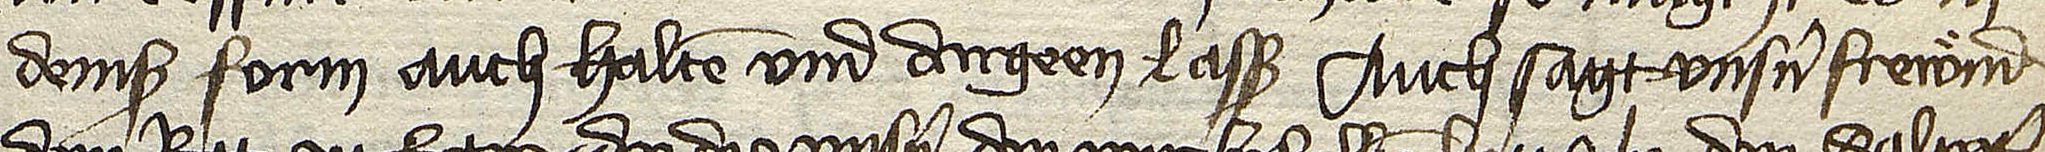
demſ* form auch halte* vnd dargeen laſſ* Auch ſagt vnſn* freẅnd*
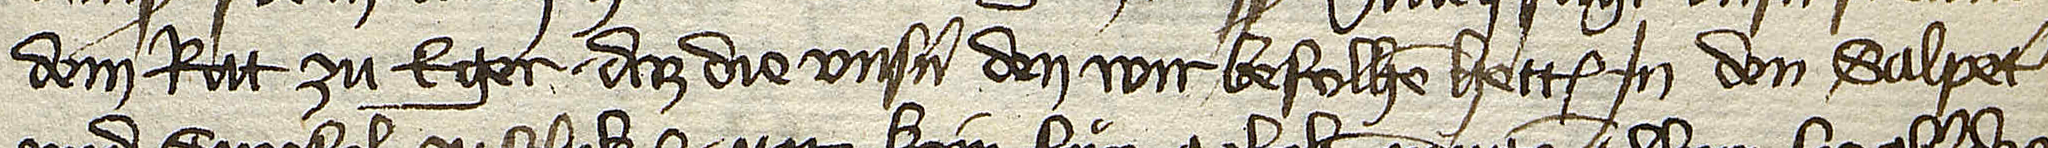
dem Rat ʒu Eger / daʒ die vnſn* den wir befolhe* hett* In den Salpet*
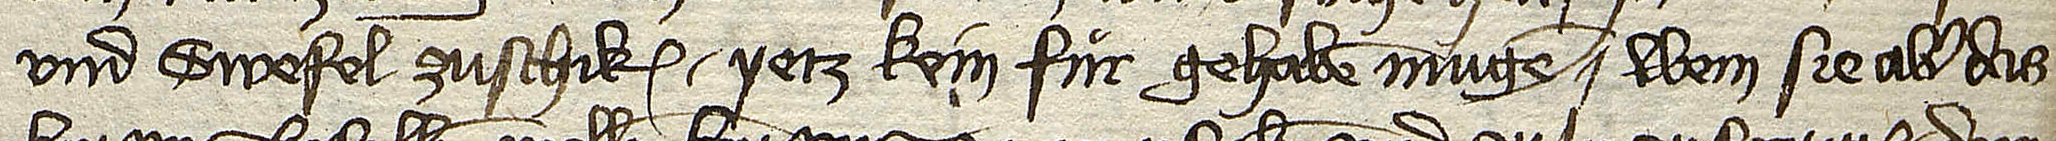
vnd Swefel ʒuſchik* / yecʒ kein für gehabe* müge* / wem ſie ab* das
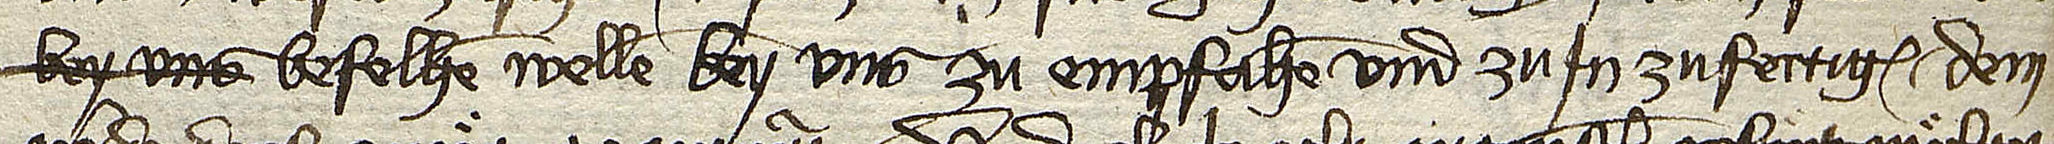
bey vns befelhe* welle* bey vns ʒu empfahe* vnd ʒu In ʒu fertig* / dem
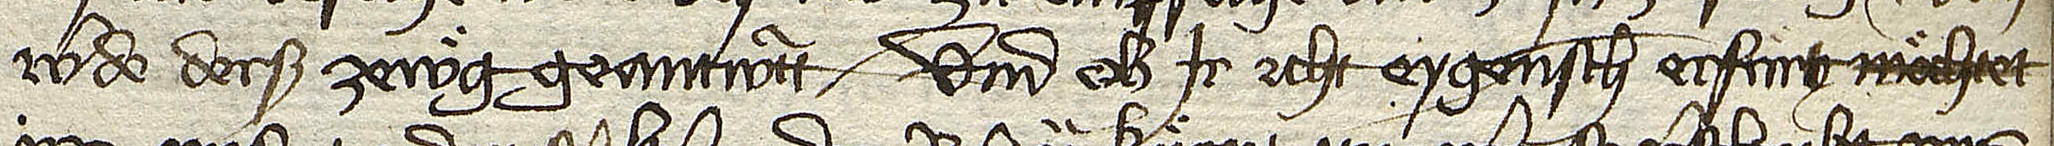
w*de derſ* ʒeẅg geantwt* / Vnd ob Ir icht eygenſch* erfürt möchtet
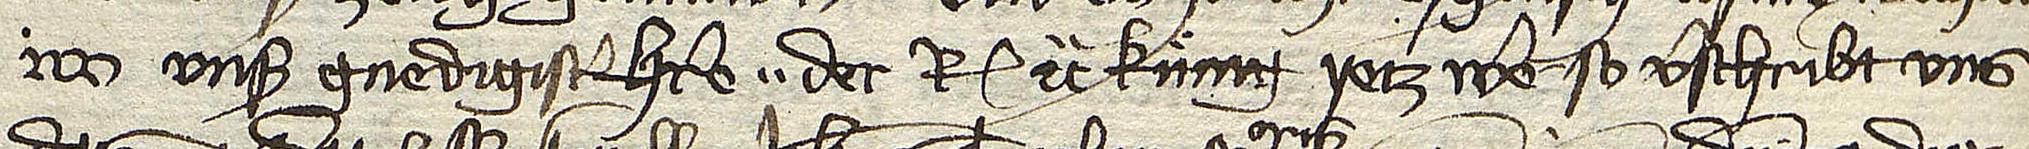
wo vnſ* gnedigiſt* hr*e ~ der R* ec* künig yecʒ w*e ſo v*ſchribt vns
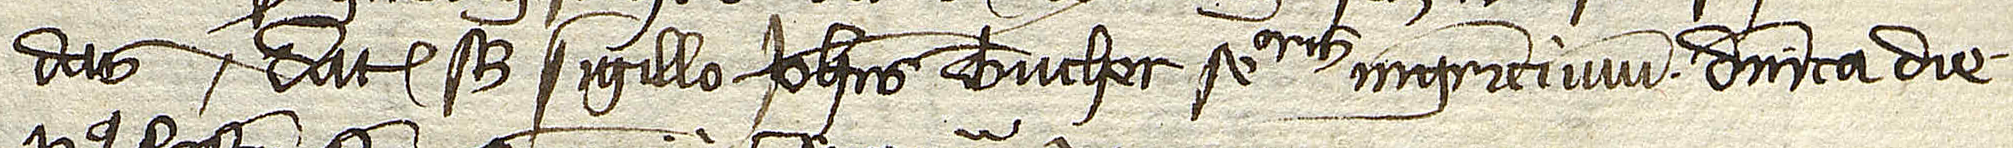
das / Dat* ſ* ſigillo Iohis* Tucher ſe* mgriciuiu* dnica* die
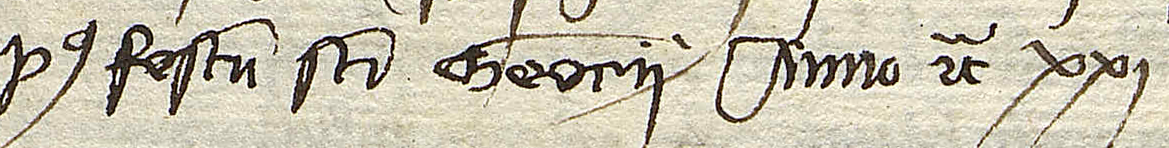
p* feſtu* ſci* Georii Anno ec* xxi
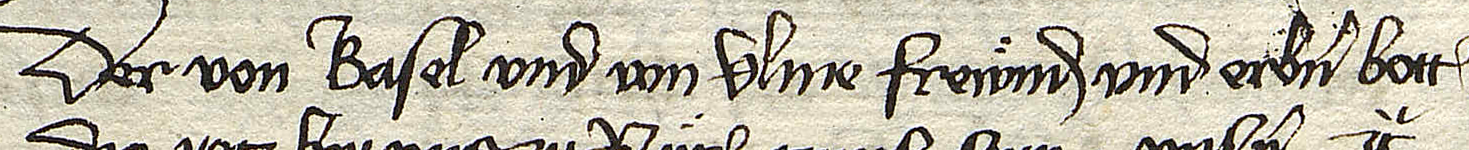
Der von Baſel vnd von Vlme freẅnd* vnd erbn* bott*
